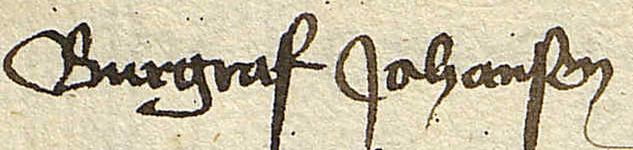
Burgraf Iohanſen
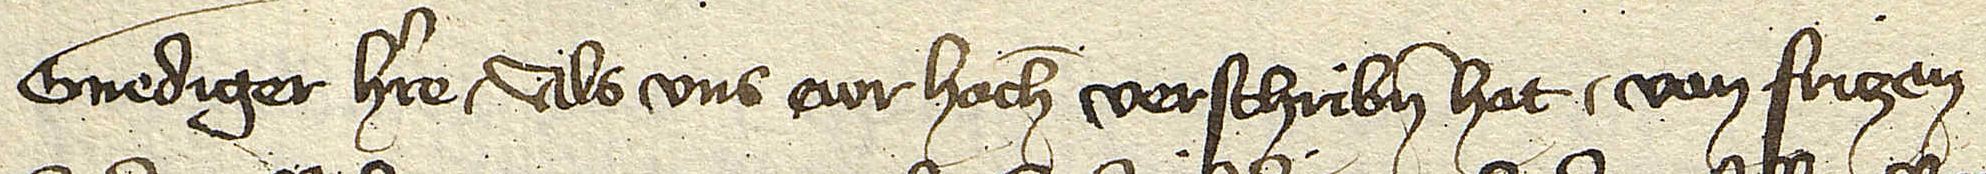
Gnediger h*re / Als vns ewr hoch* verſchribn* hat / von fricʒen
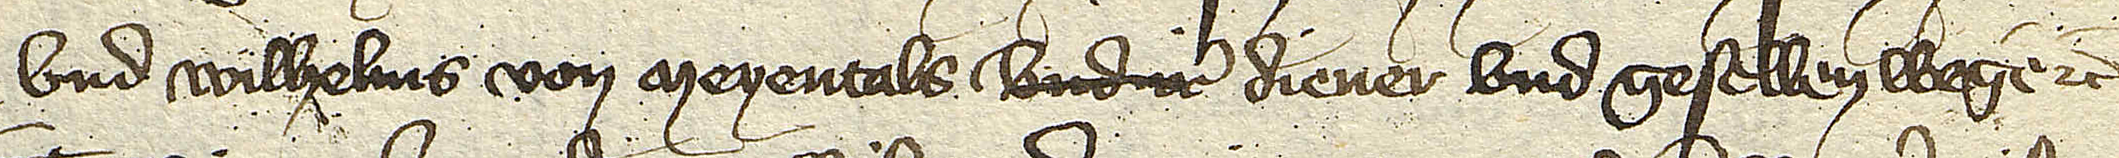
vnd wilhelms von Meyentals / vnd ir* diener vnd geſellen wege* ec*
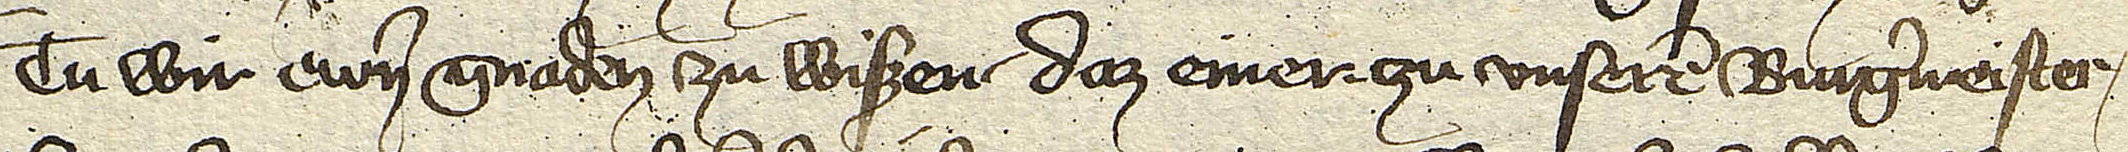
Tu wir ewn* gnaden cʒu wiſʒen / daʒ einer cʒu vnſere* Burg*meiſter /
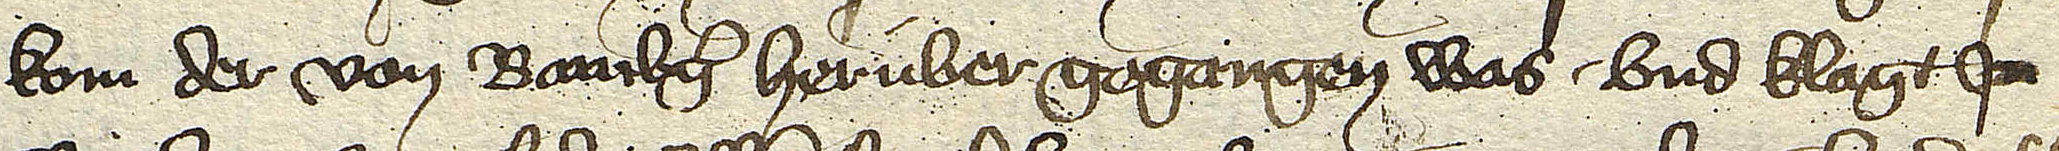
kom der von Bamb*g herüber gegangen was / vnd klagt In
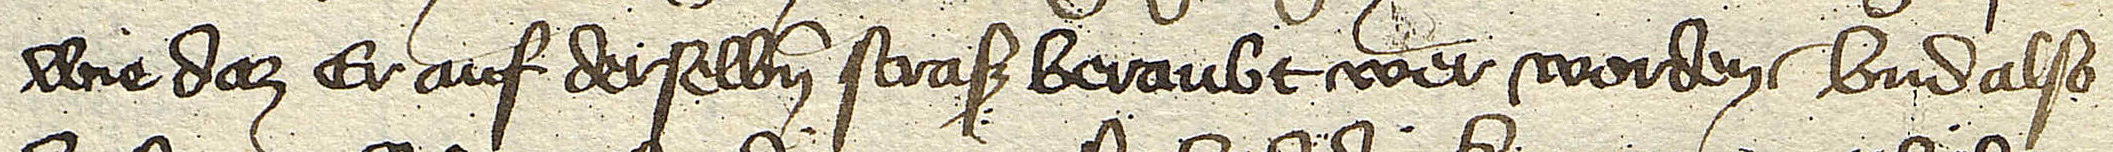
wie daʒ Er auf derſelbn* ſtraſʒ beraubt wer worden / vnd alſo
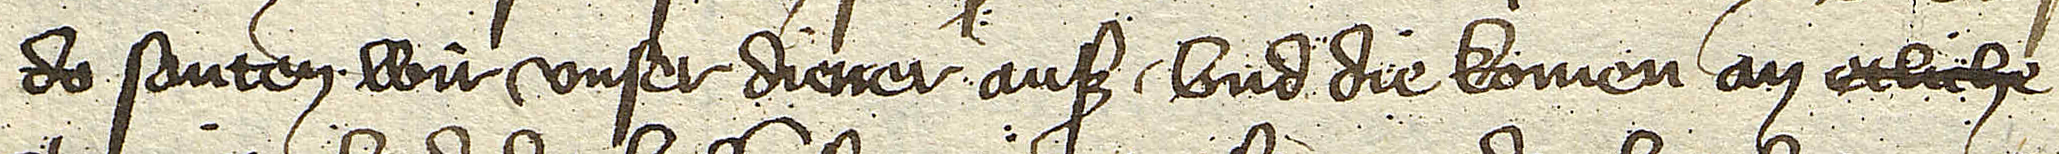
do ſanten wir vnſer diener auſʒ / vnd die komen an etliche
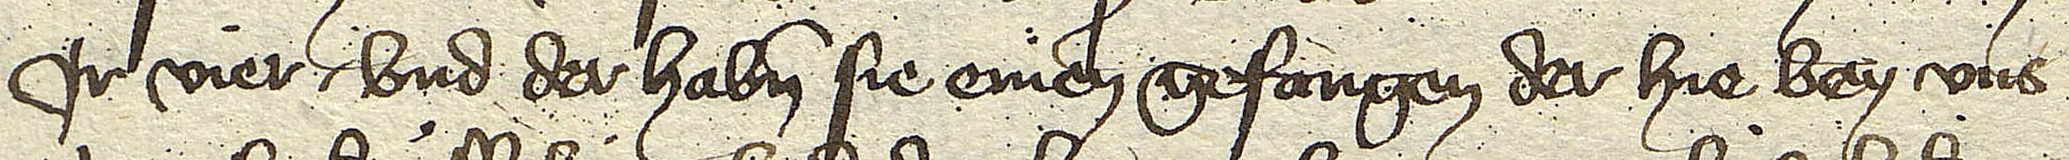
Ir vier / vnd der habn* ſie einen gefangen der hie bey vns
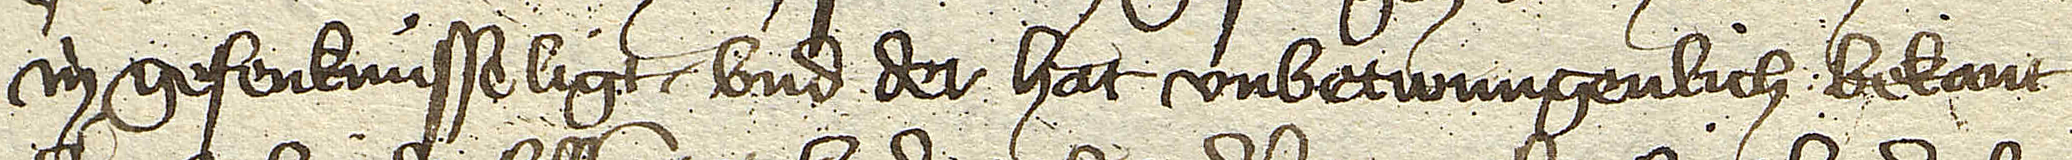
in gefenknüſſe ligt / vnd der hat vnbetwungenlich bekant
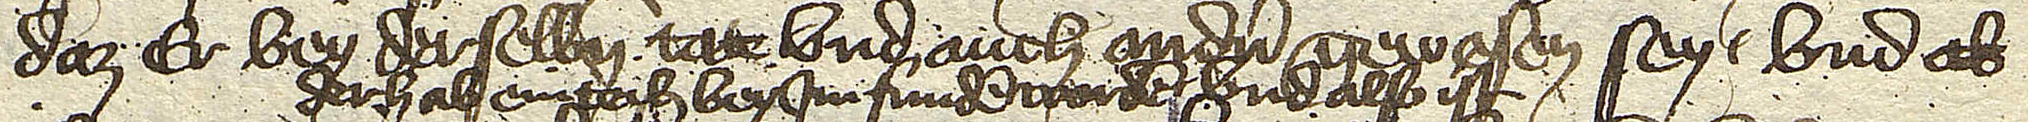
daʒ Er bey derſelbn* tate vnd auch andn* geweſen ſey / vnd ab
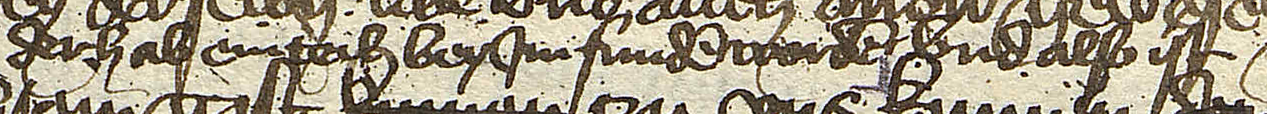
der hab ein teil bey Im funde* worde* vnd alſo iſt
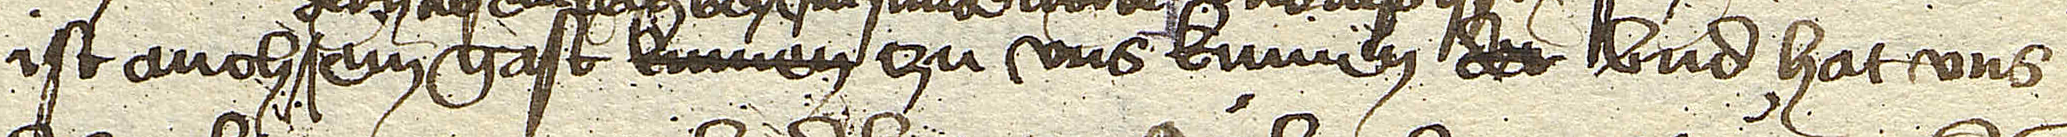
iſt auch ein gaſt kumen cʒu vns kumen der vnd hat vns
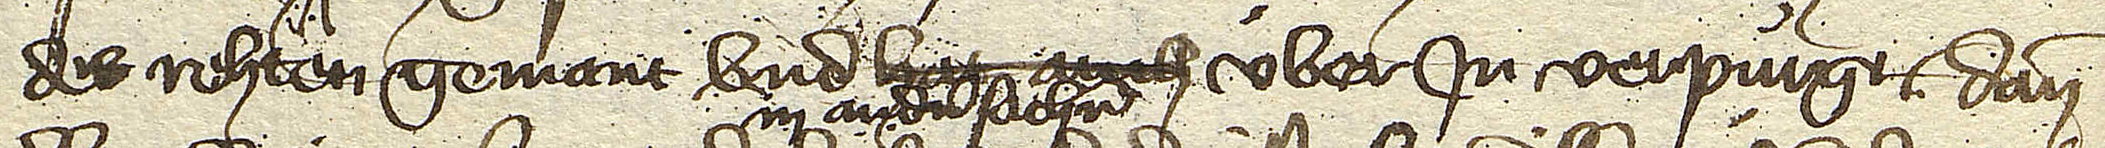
des rehten gemant vnd hat auch v̈ber In verpürgt / dan*
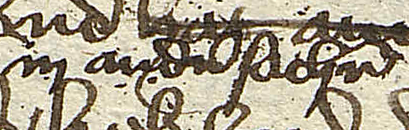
in andn* ſachn*
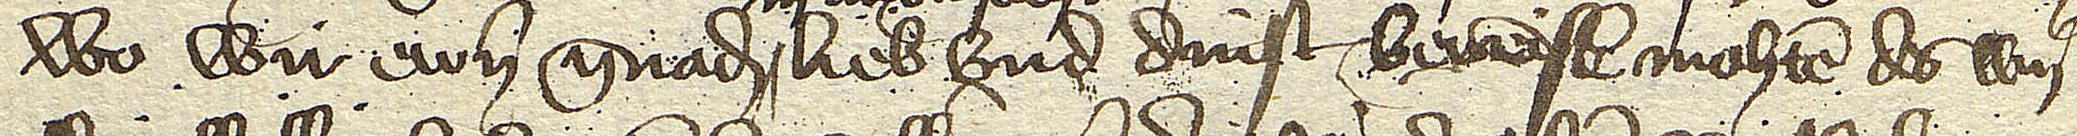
wo wir ew*n gnad* lieb vnd dinſt beweiſe* möhte* des wn*
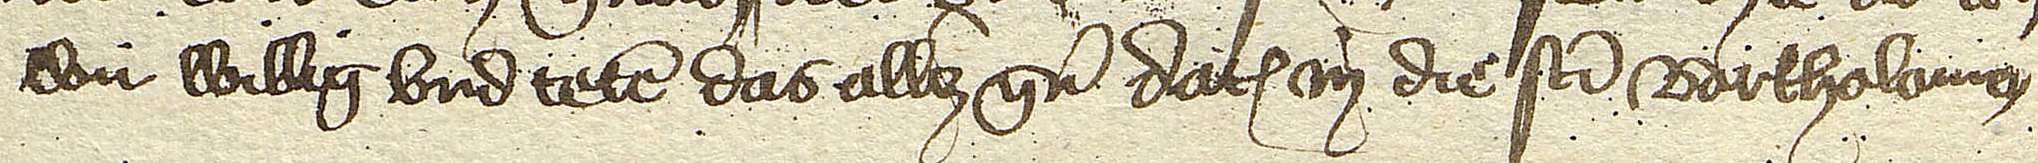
wir willig vnd tete* das allcʒ* gn* dat* in ſci* Bartholomey
